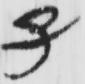子
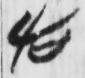左
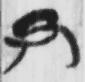尹
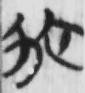{力它}
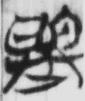○（舉）
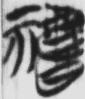禱
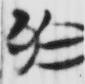於
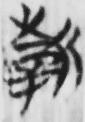新
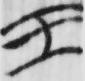王
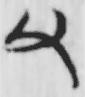父
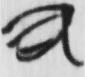司
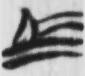馬
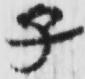子
